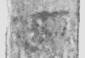百
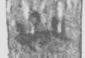卅
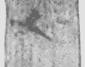五
